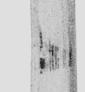之
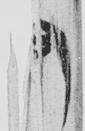又
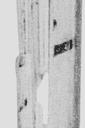子
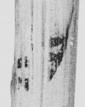曰
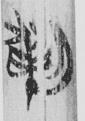○（列）
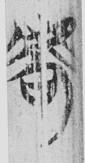○（乎）
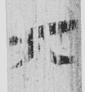亓（其）
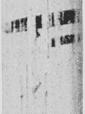下
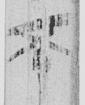不
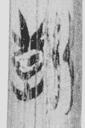折（折）
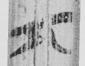亓（其）
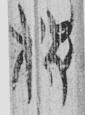枳（枝）
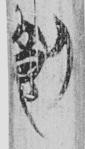飤（食）
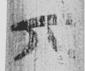亓（其）
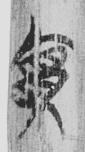實
